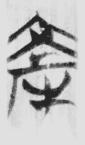產
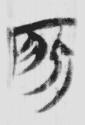所
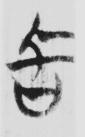旨
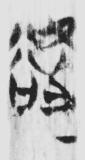欲
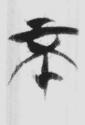不
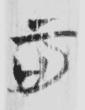可
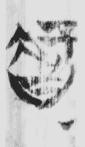智
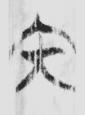內
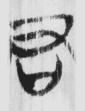君
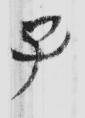子
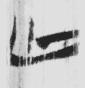亡
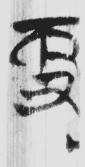{卞又}
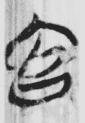官
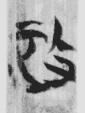政
